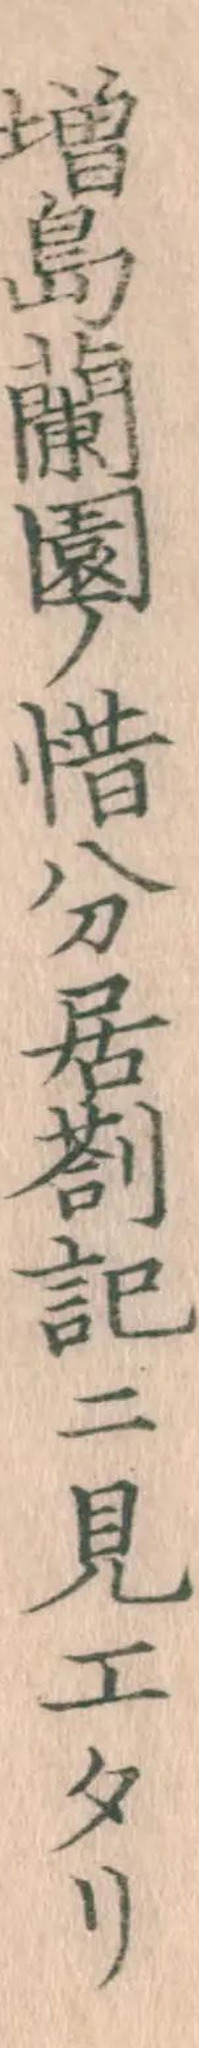増島蘭園ノ惜分居剳記ニ見エタリ
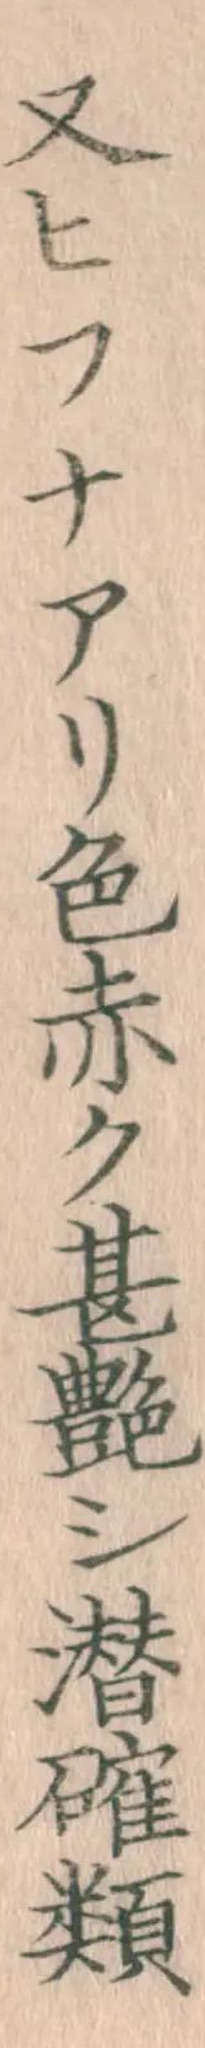又ヒフナアリ色赤ク甚艶シ潜確類
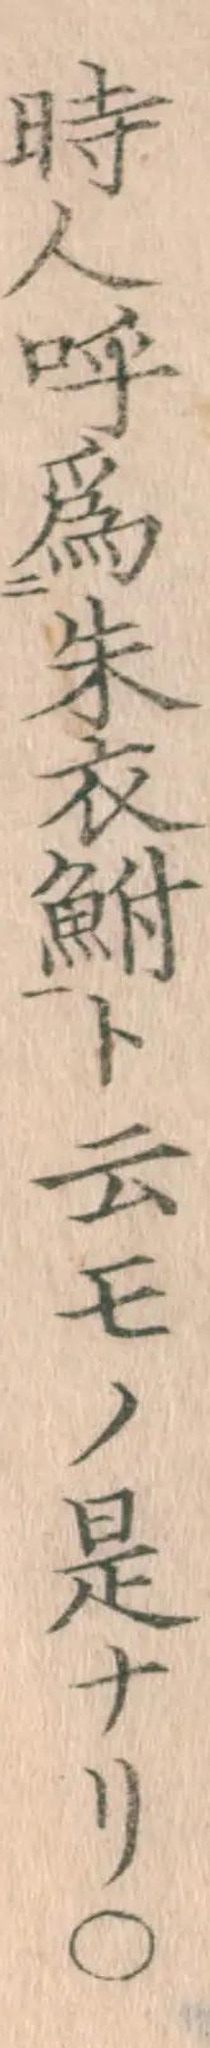時人呼為朱衣鮒ト云モノ是ナリ〇
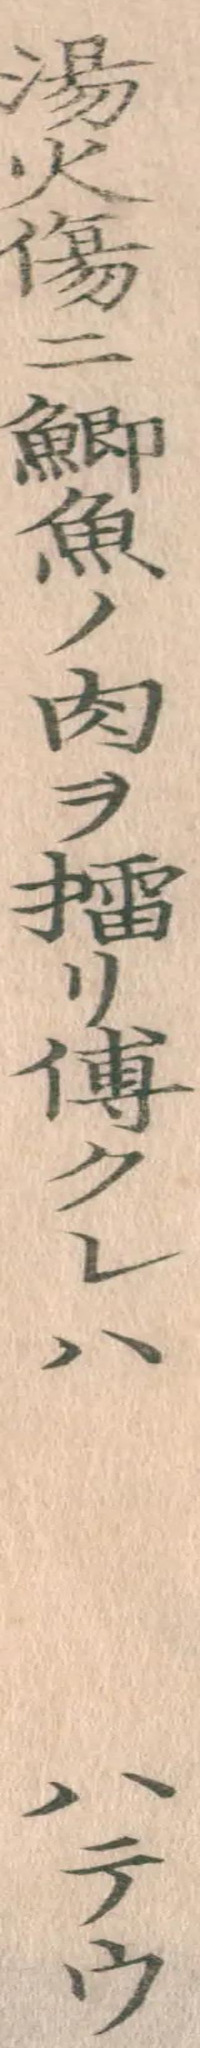湯火傷ニ鯽魚ノ肉ヲ擂リ伝クレハ
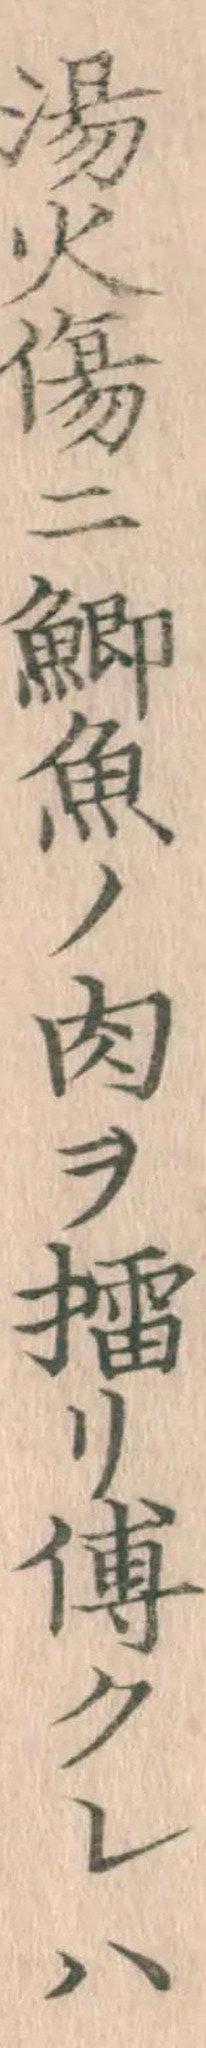湯火傷ニ鯽魚ノ肉ヲ擂リ伝クレハ
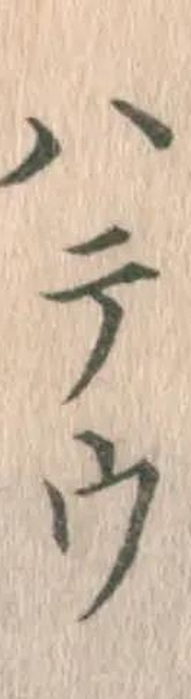ハテウ
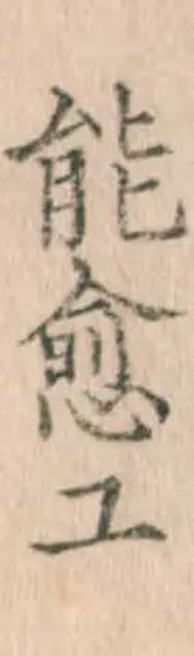能愈ユ

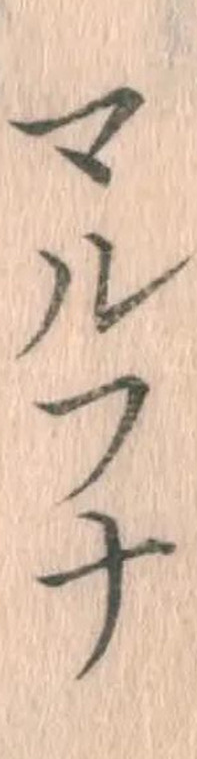マルフナ
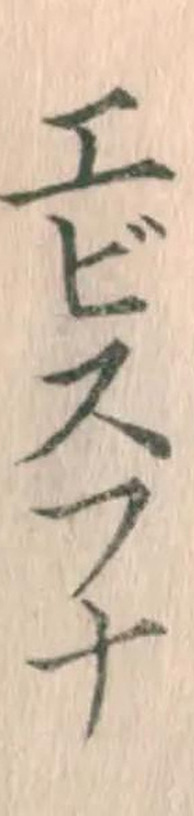エビスフナ

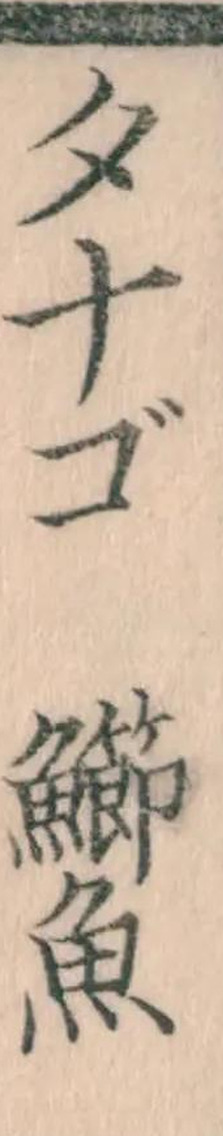タナゴ䲙魚
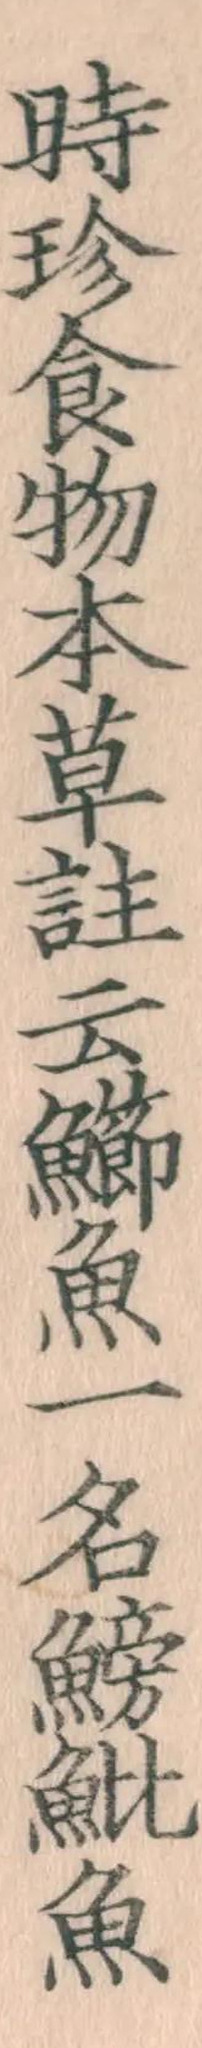時珍食物本草註云䲙魚鰟魮魚
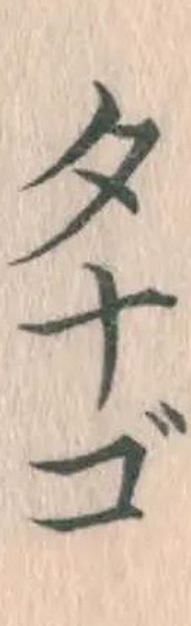タナゴ
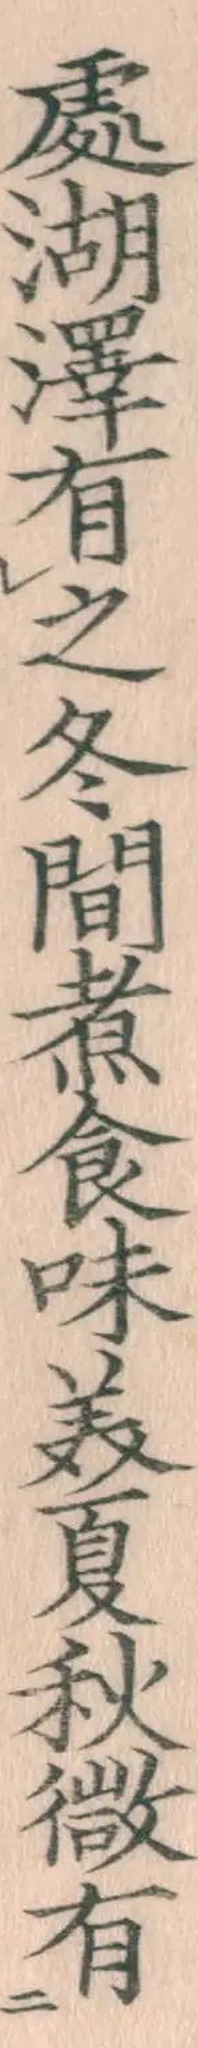処湖沢有之冬間煮食味美夏秋微有
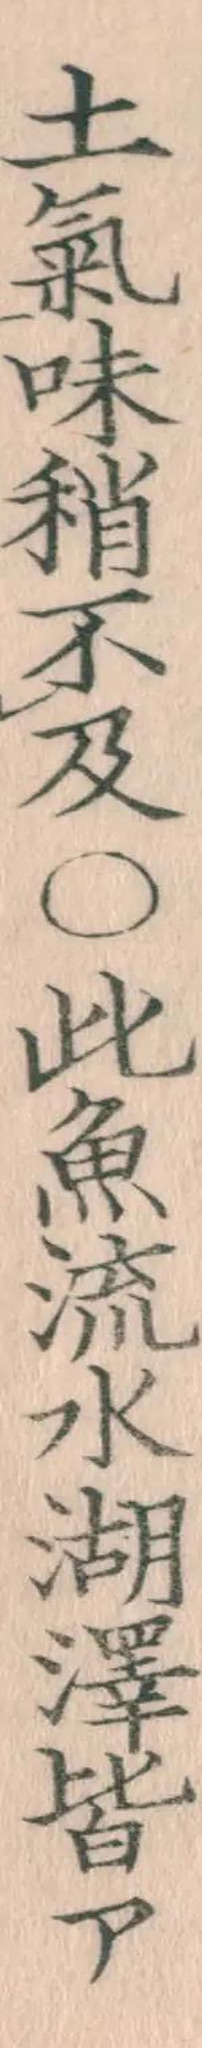土気味稍不及〇此魚流水湖沢皆ア
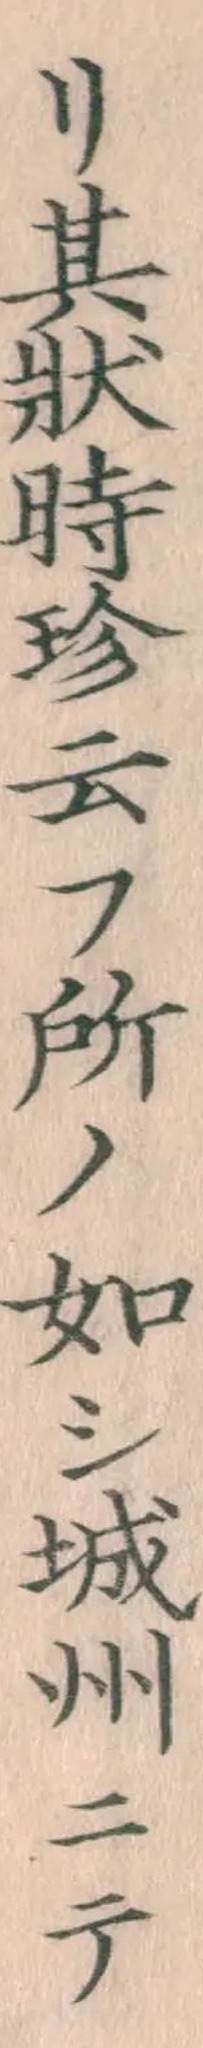リ其状時珍云フ所ノ如シ城州ニテ
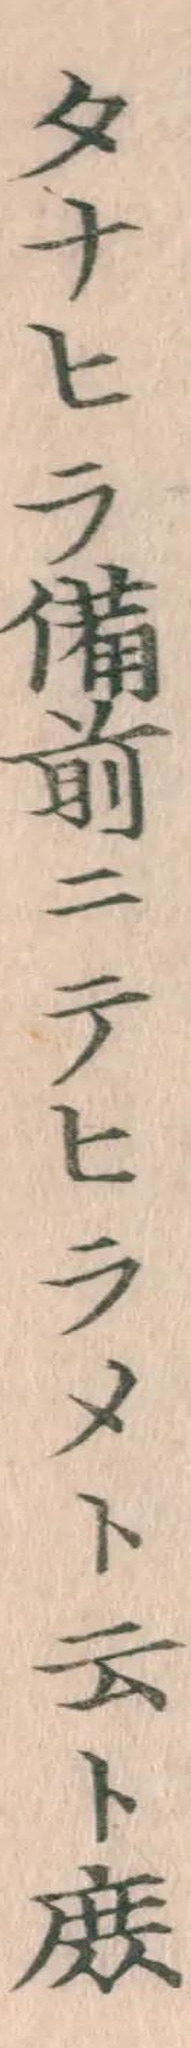タナヒラ備前ニテヒラメト云ト庶
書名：皇和魚譜 2巻
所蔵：国立国会図書館 National Diet Library, JAPAN
